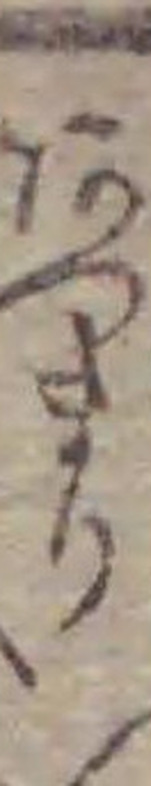あつまり
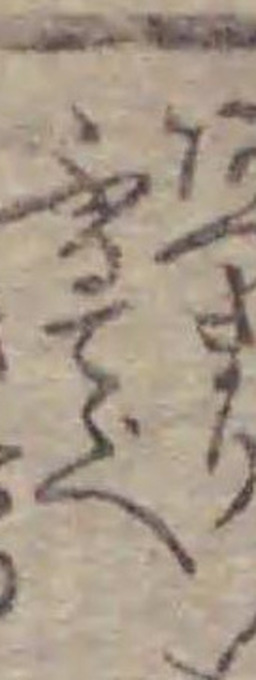ふるてらへ
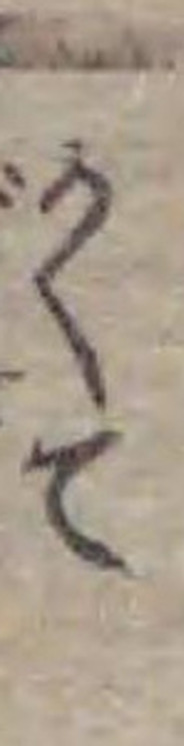かくて
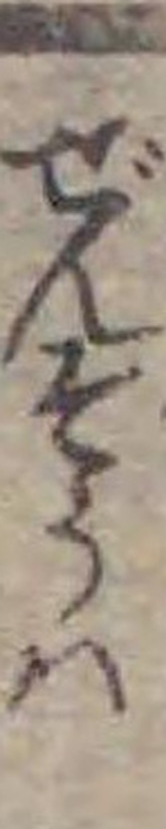ぜんそうは
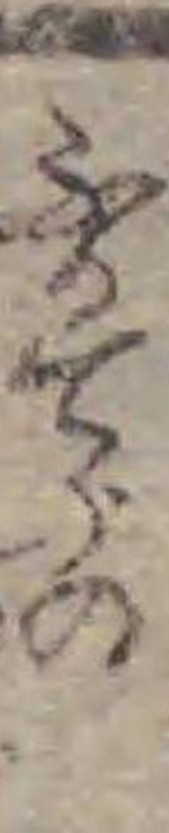ふるてらの
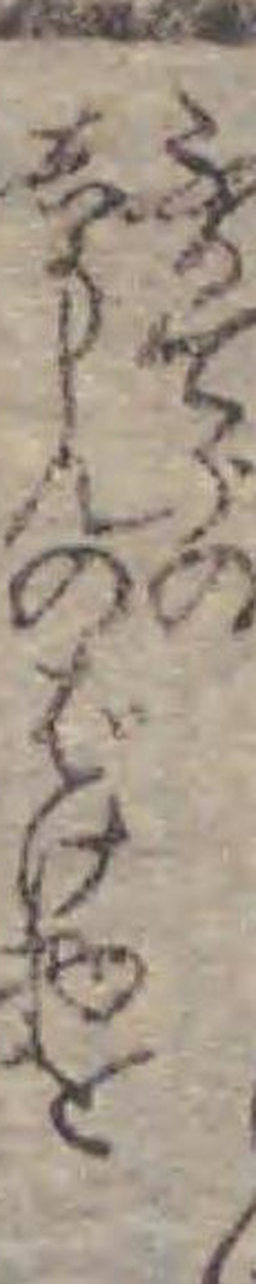しうしんのばけ物を
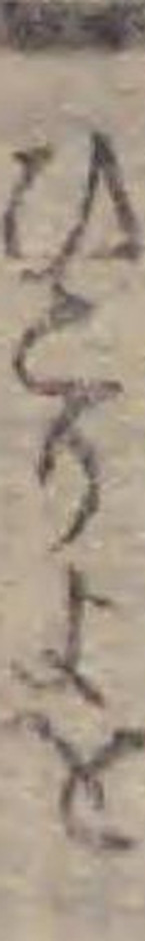ひとりよを
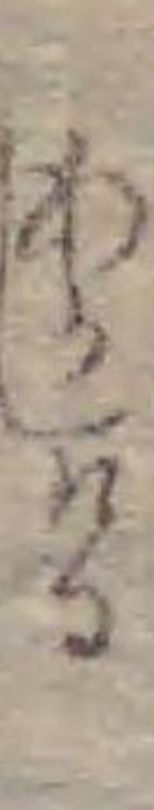あかしける
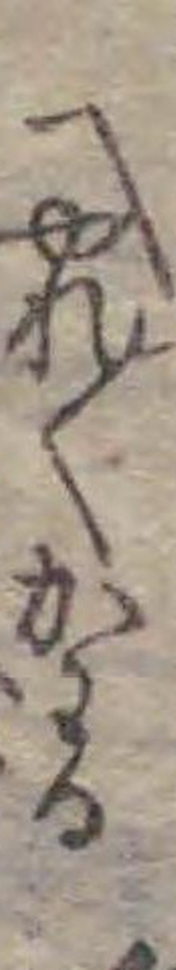〽やれ〳〵かわる
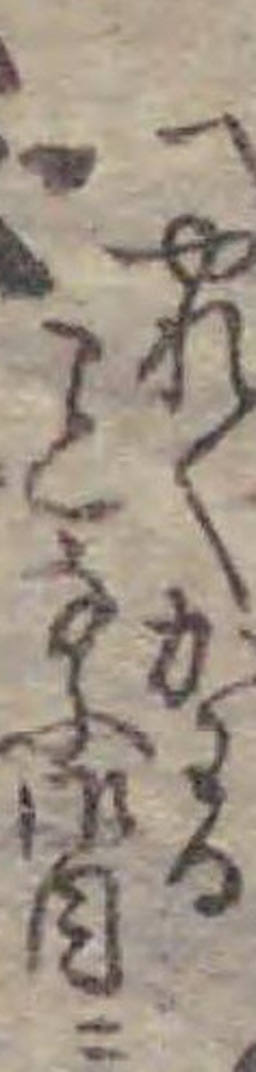ことなふ御目に
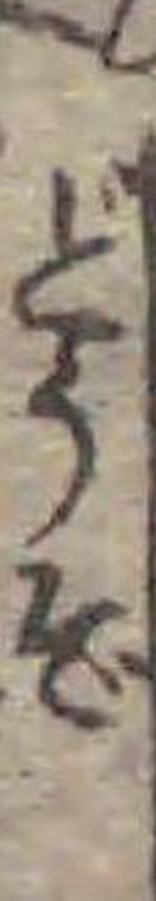どうぞ
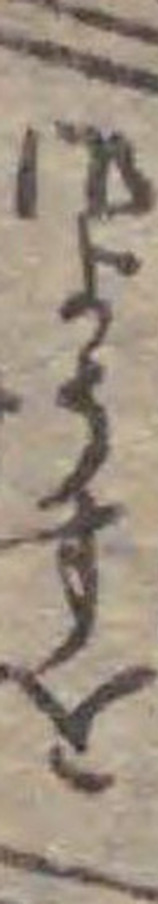御ようすを
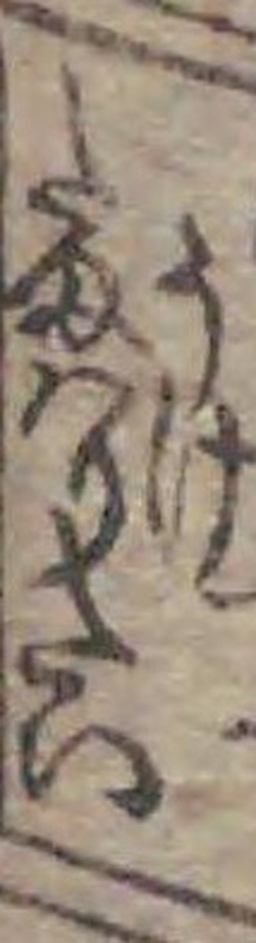たまはりたい
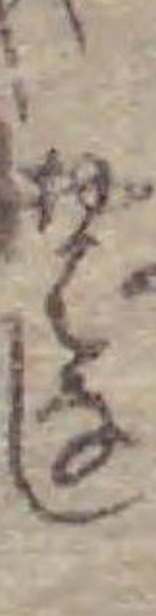おはなし

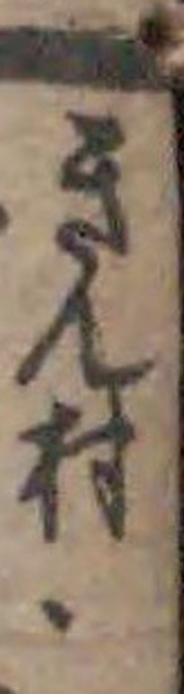きん村
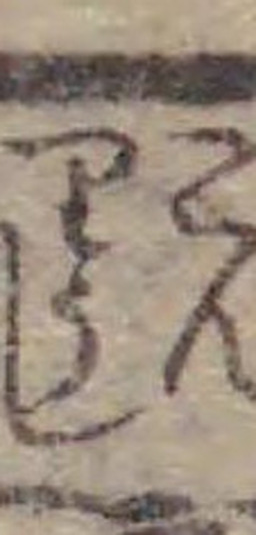りうし
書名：歌の化物一寺再興 : 2巻
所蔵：国立国会図書館 National Diet Library, JAPAN
